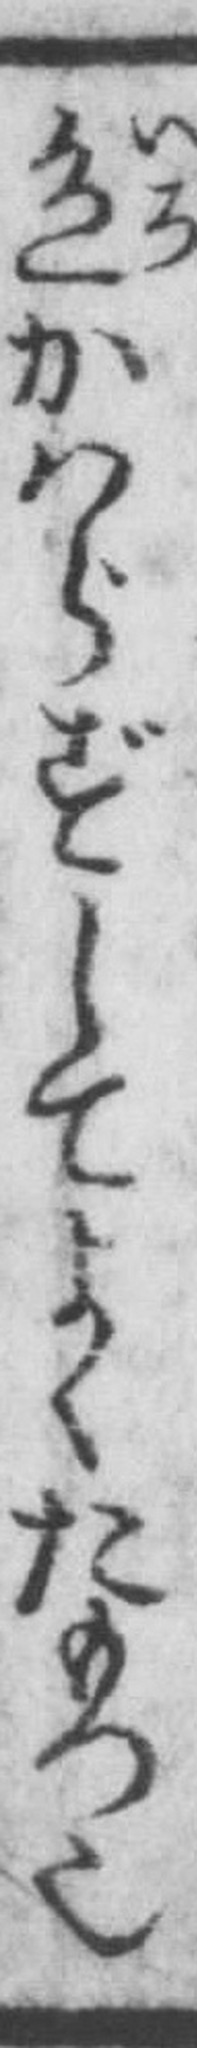色かハらずしてよくたもつ也
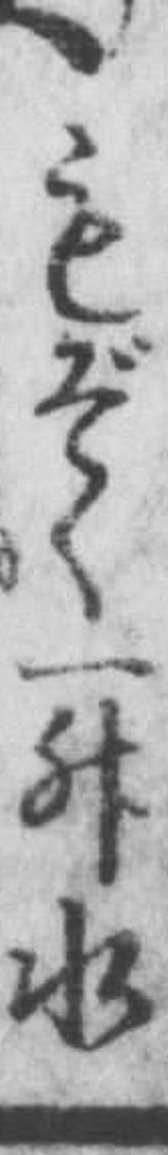もずく一升水
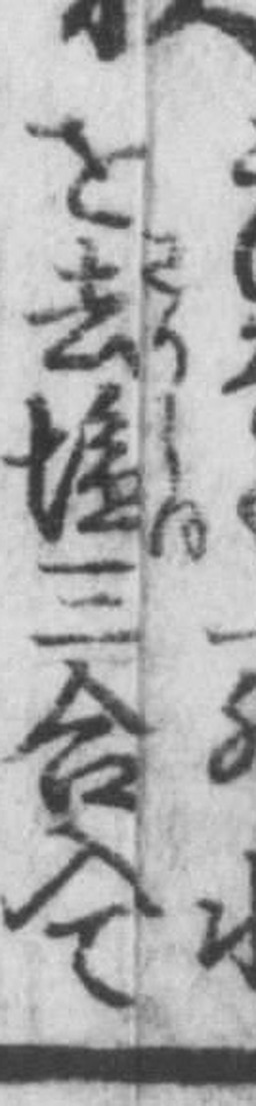を去り塩三合入て
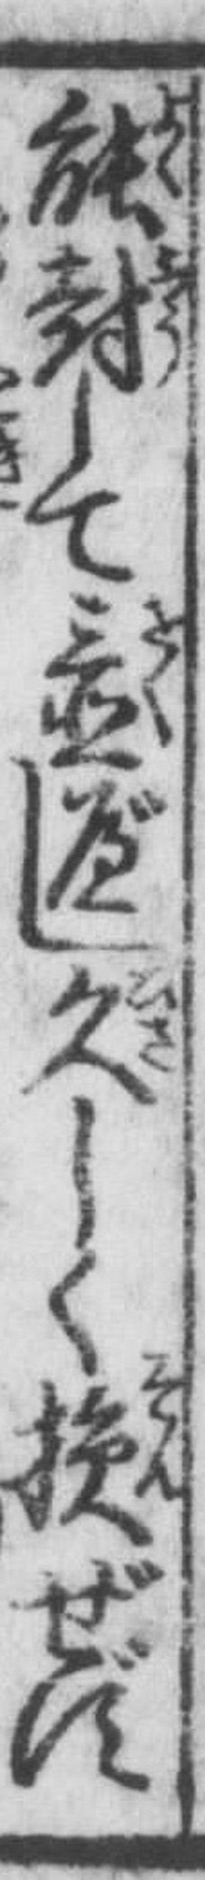能封して置べし久しく損ぜず
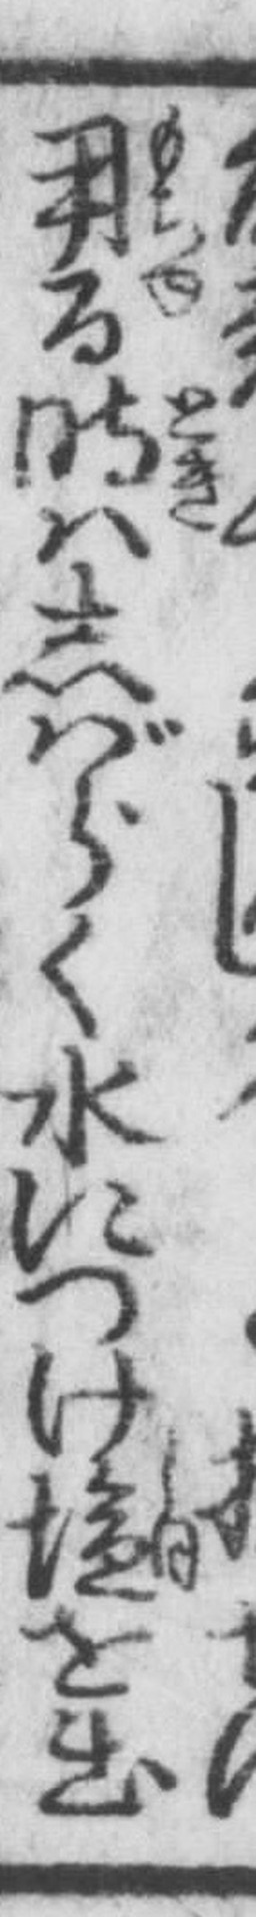用る時ハしばらく水につけ塩を出
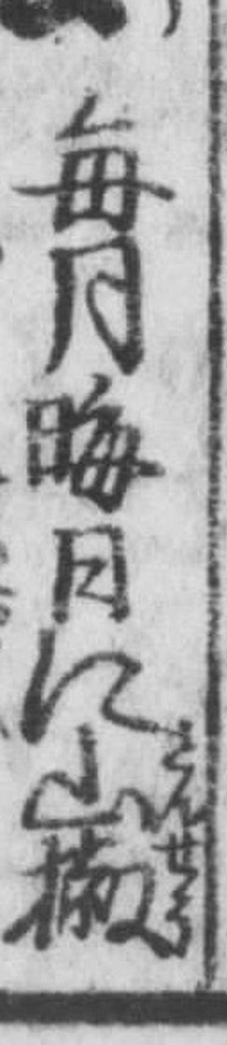毎月晦日に山椒
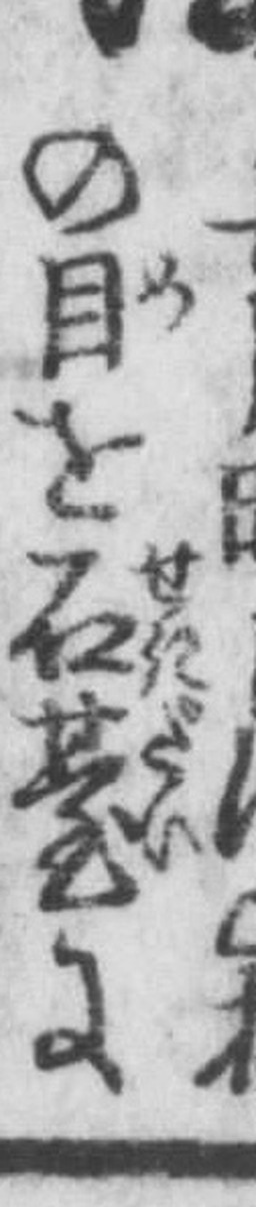の目を石臺に
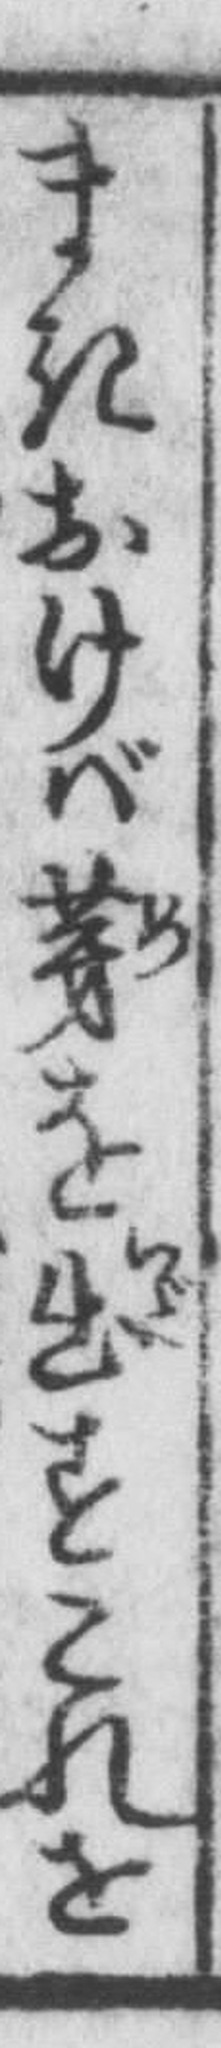まきおけバ芽を出すこれを
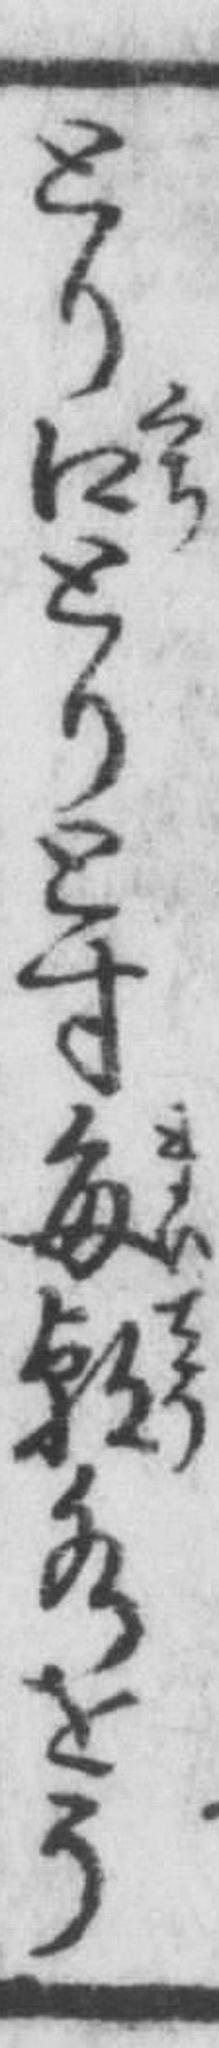とり口とりとす毎朝水をう
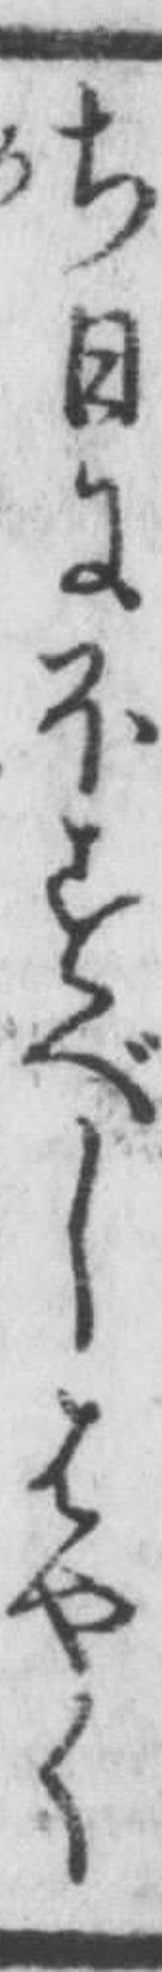ち日にほすべしはやく
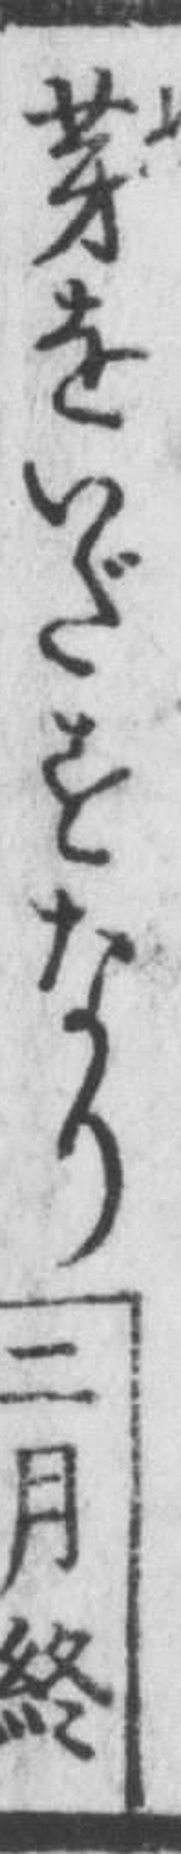芽をいだすなり二月終
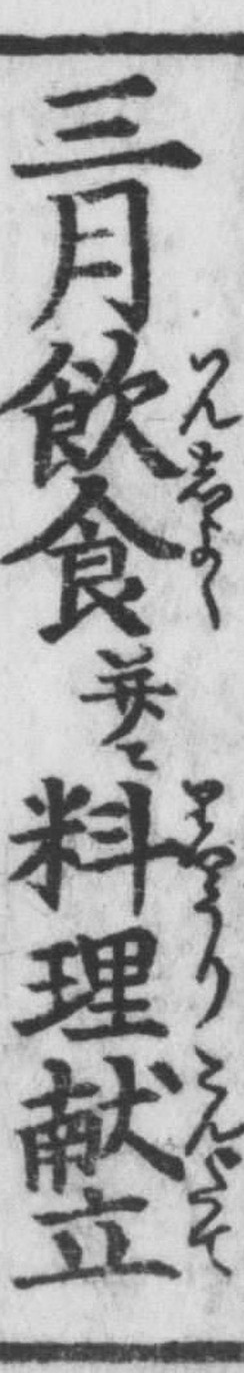三月飲食并料理献立
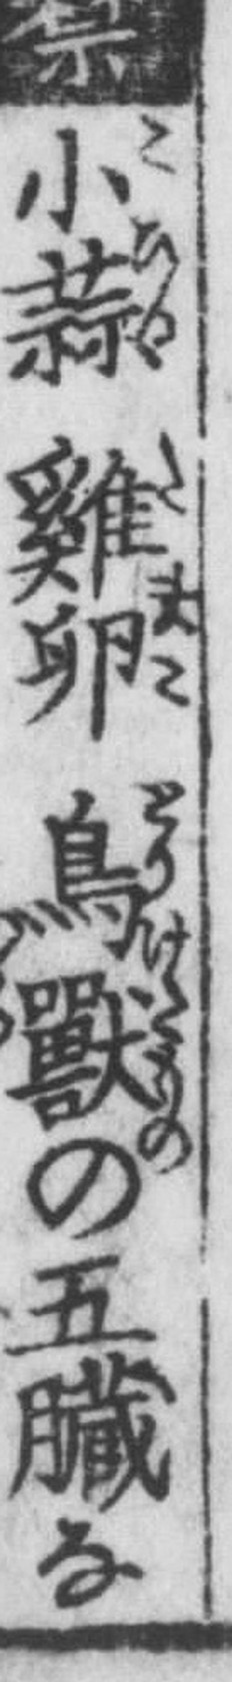禁小蒜鶏卵鳥獣の五臓な
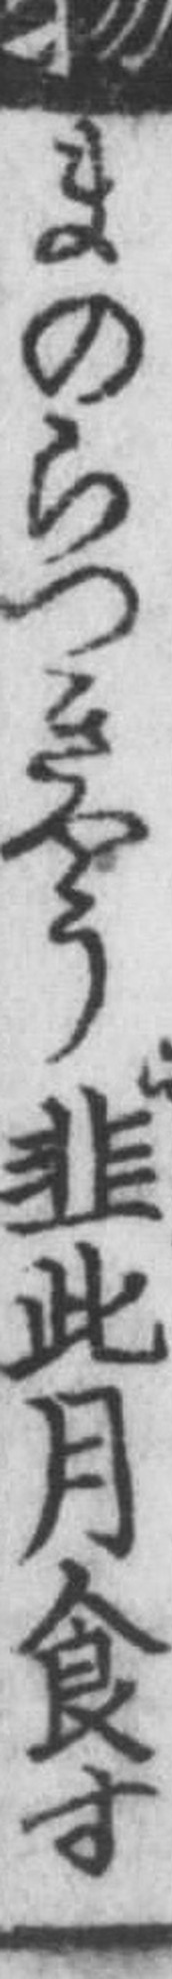物まのらつきやう韭此月食す
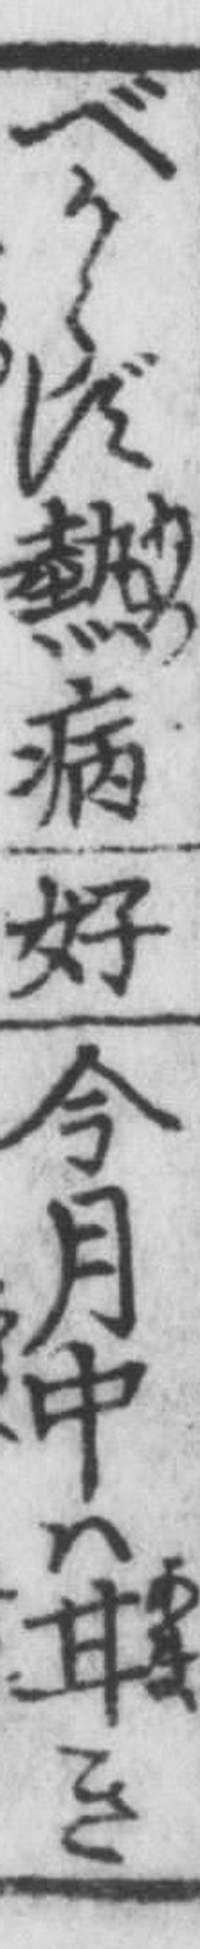べからず熱病好今月中は甘き
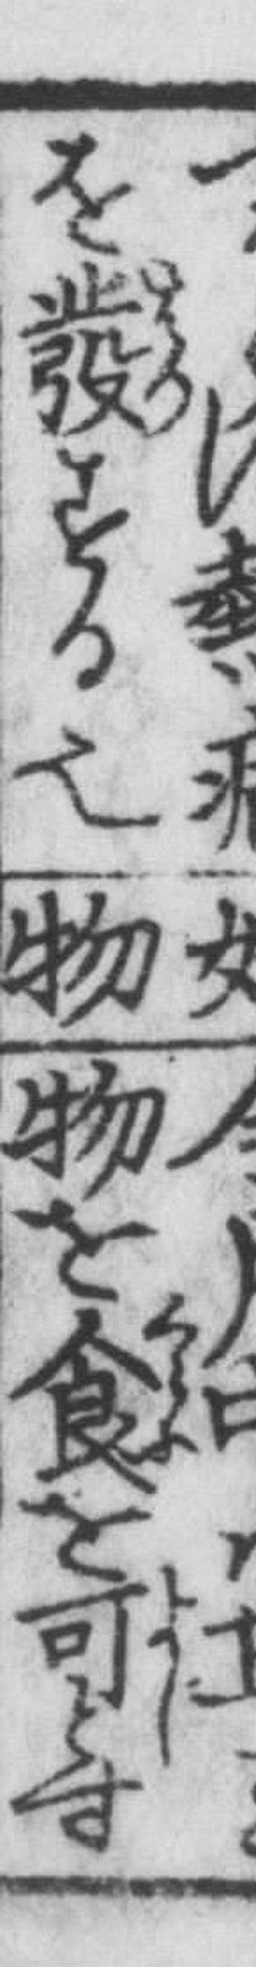を發する也物物を食べるを可とす
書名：当世料理筌
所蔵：大阪府立大学学術情報センター 国文学研究資料館
